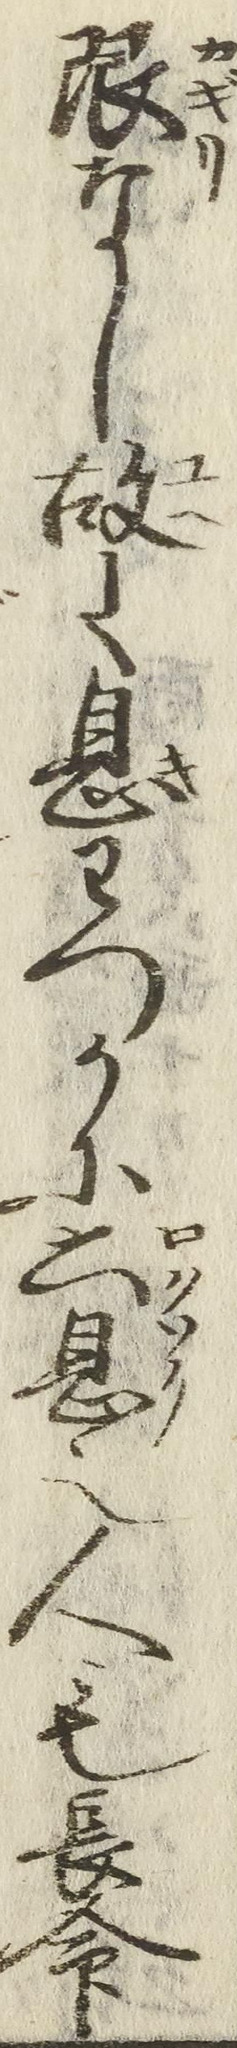限なし故に息わつかに六息也人も長命
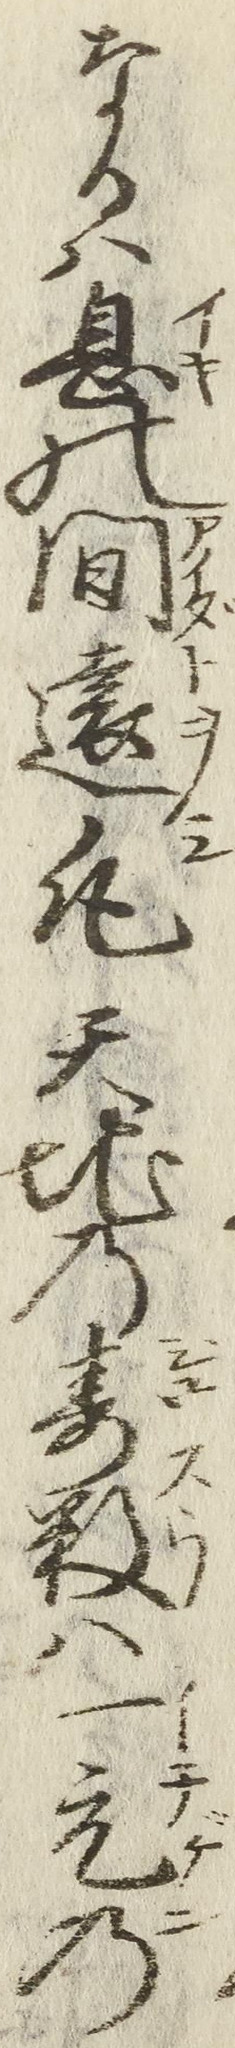なるは息の間遠凡天地の寿数は一元の
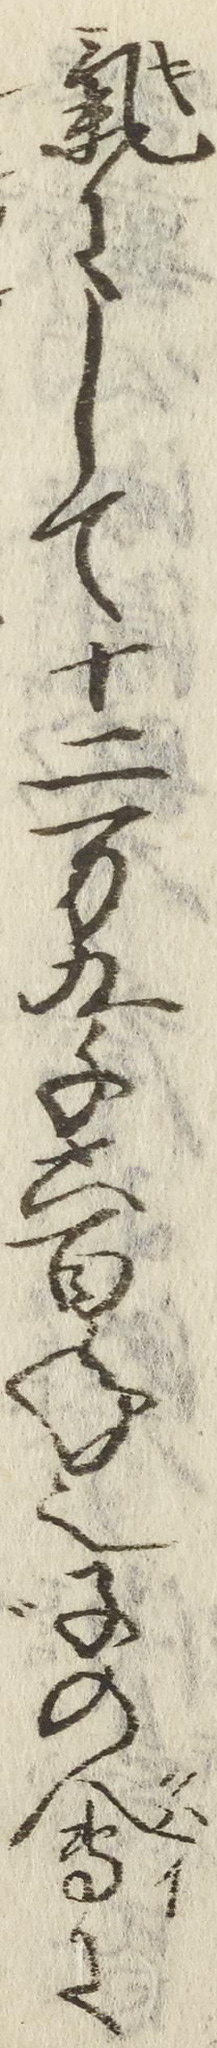気にして十二万九千六百年也子の会に
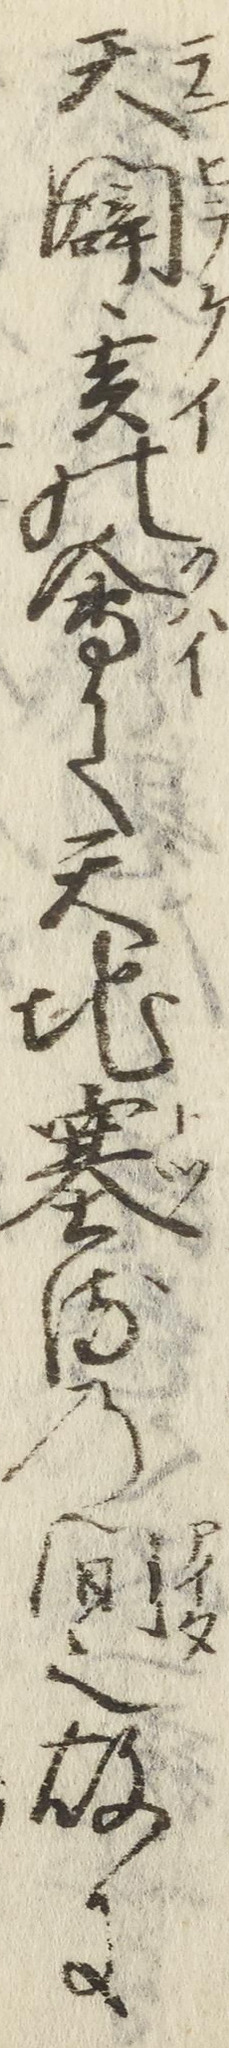天闢亥の会に天地塞るの間也故に
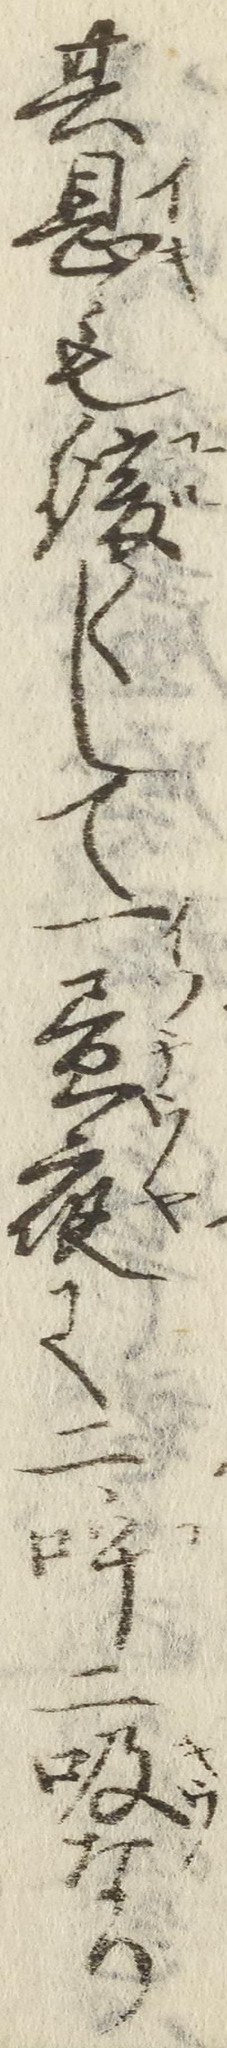其息も緩くして一昼夜に二呼二吸なり
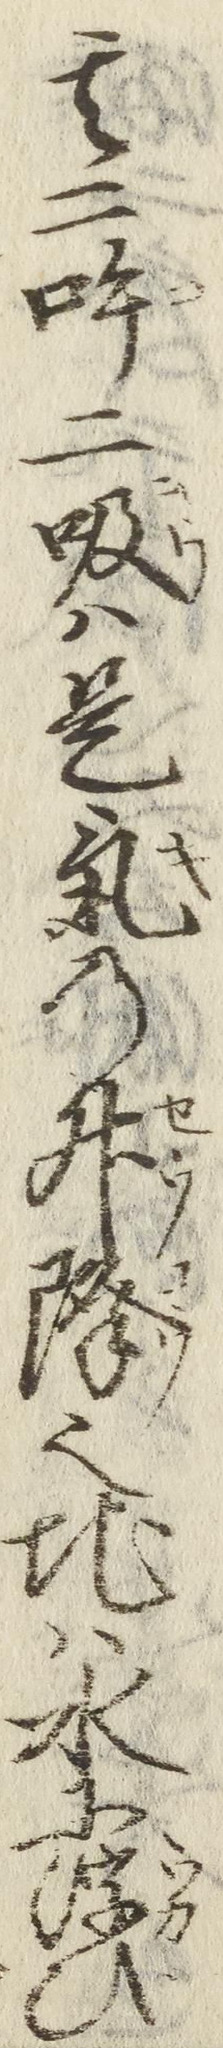其二呼二吸は是気の升降也地は水に浮ひ
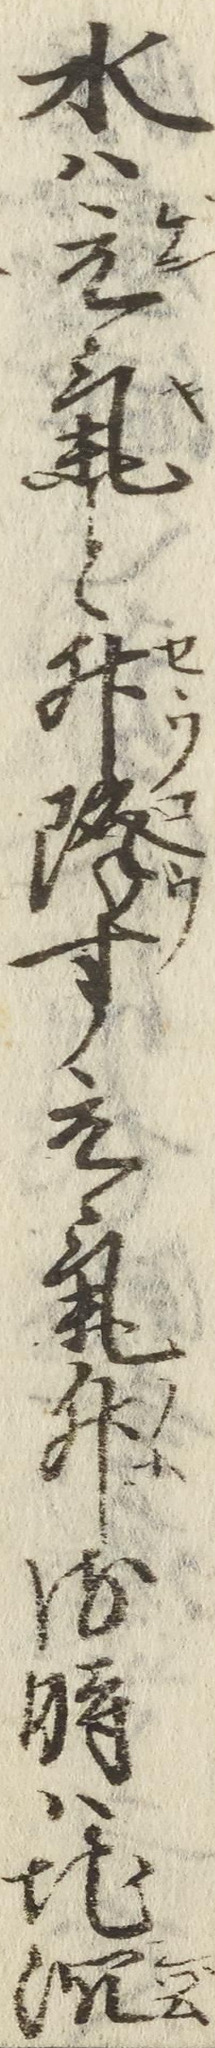水は元気と升降す元気升る時は地沈
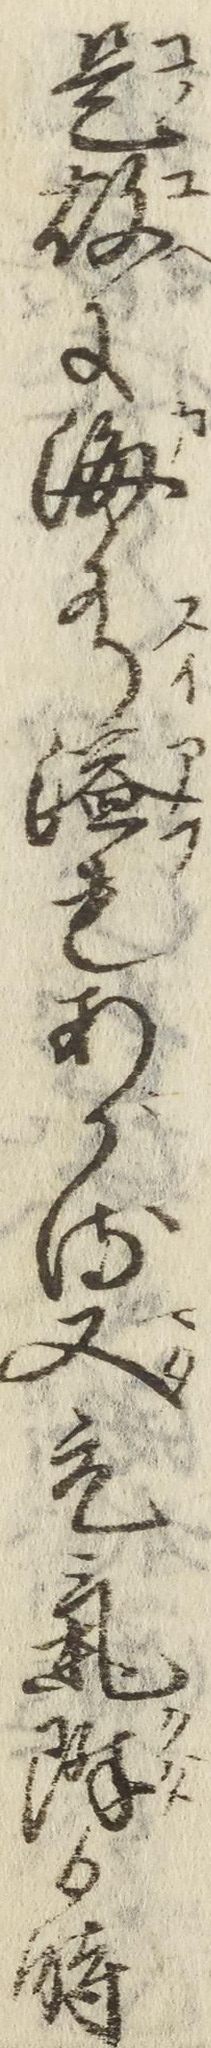是故に海水溢れあがる又元気降る時

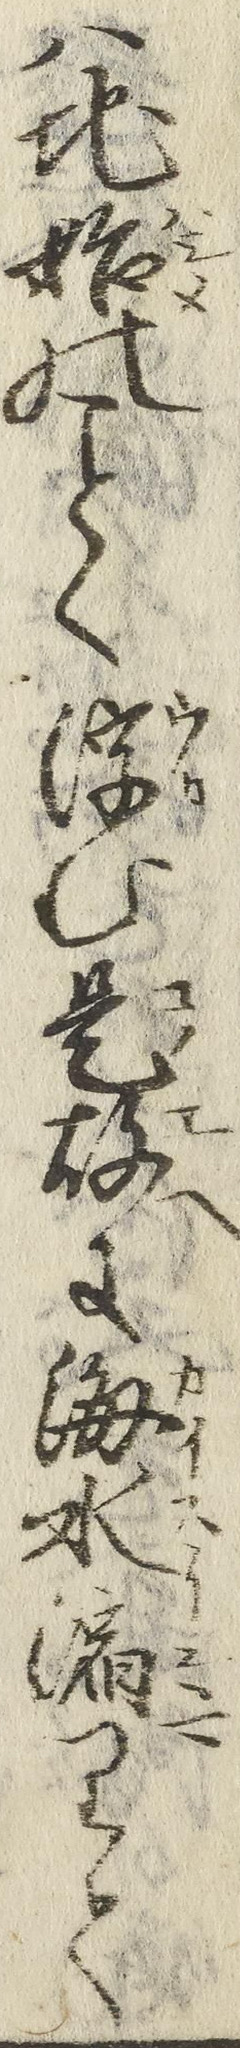は地始のことく浮む是故に海水縮りて
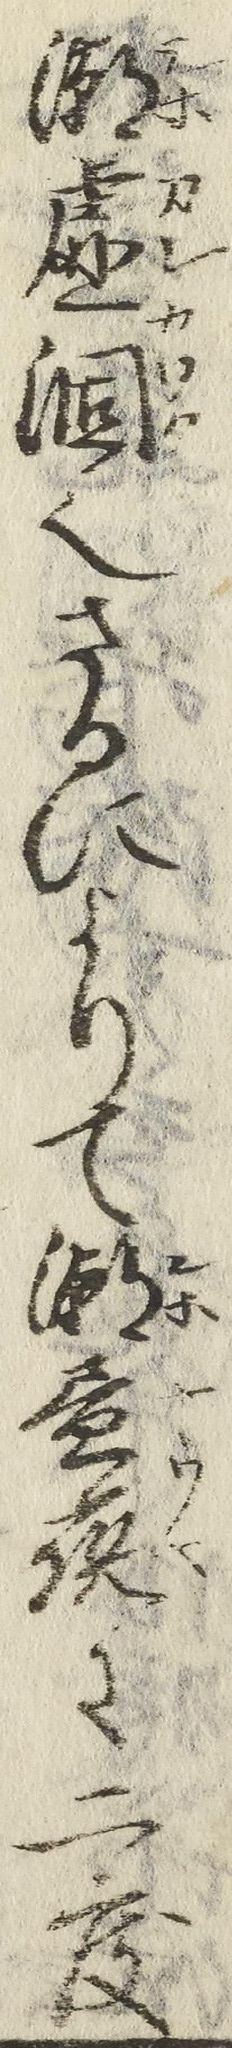潮虚涸也さるによりて潮昼夜に二度
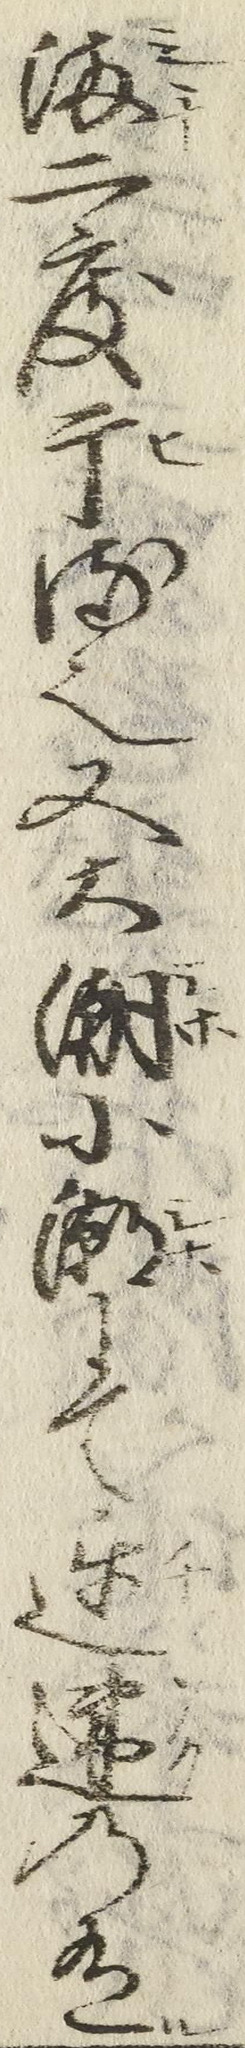満二度干る也又大潮小潮にて遅速の有ル
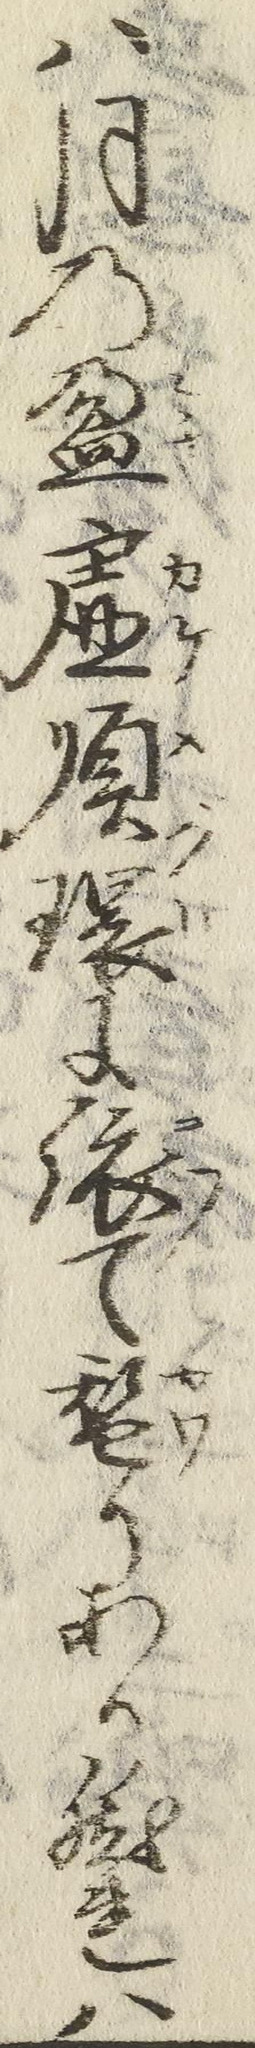は月の盈虚順環に依て替りあり然れは
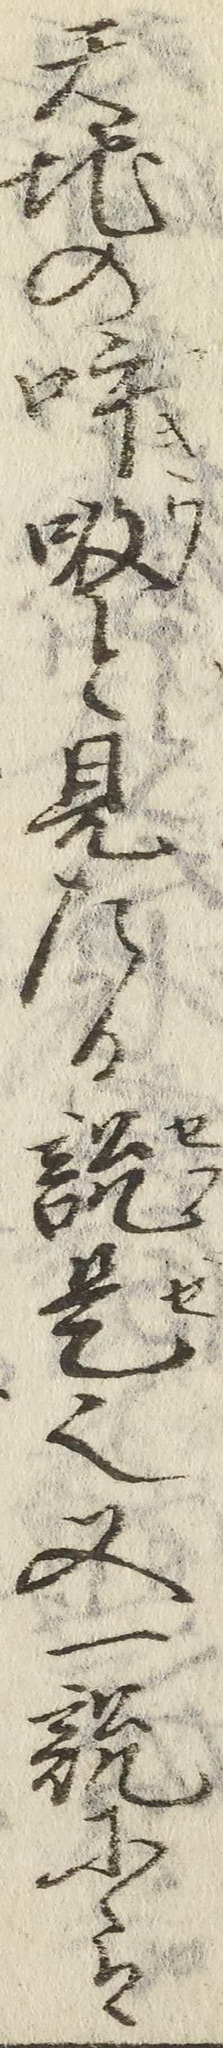天地の呼吸と見たる説是也又一説には
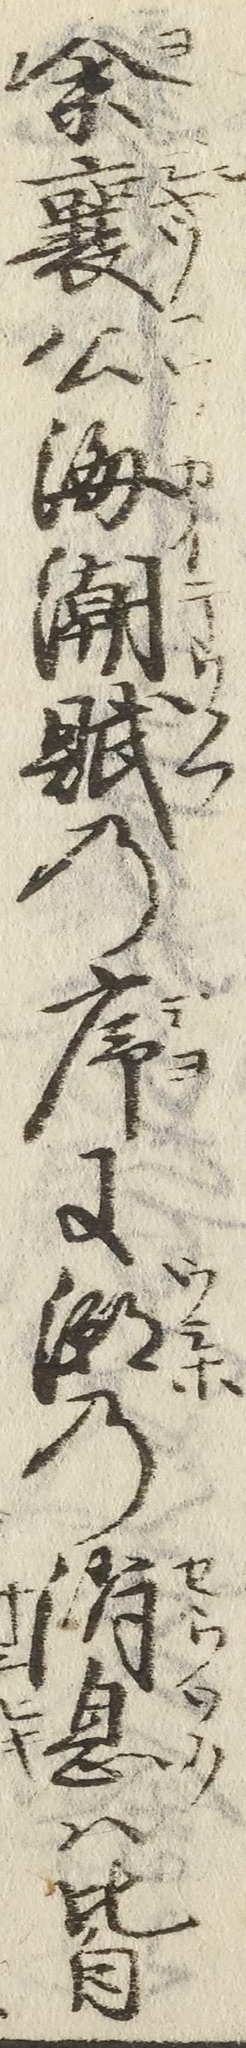余襄公海潮賦の序に潮の消息は皆
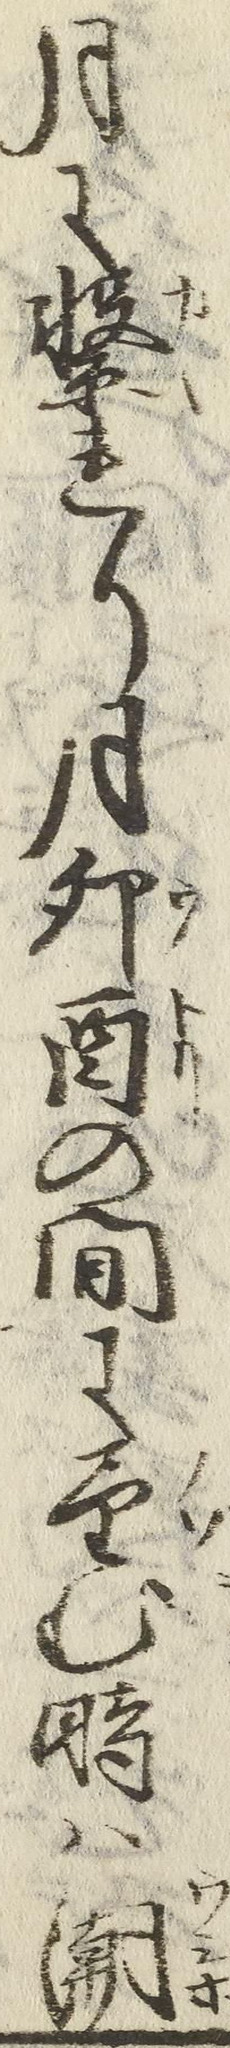月に繋れり月卯酉の間に望む時は潮
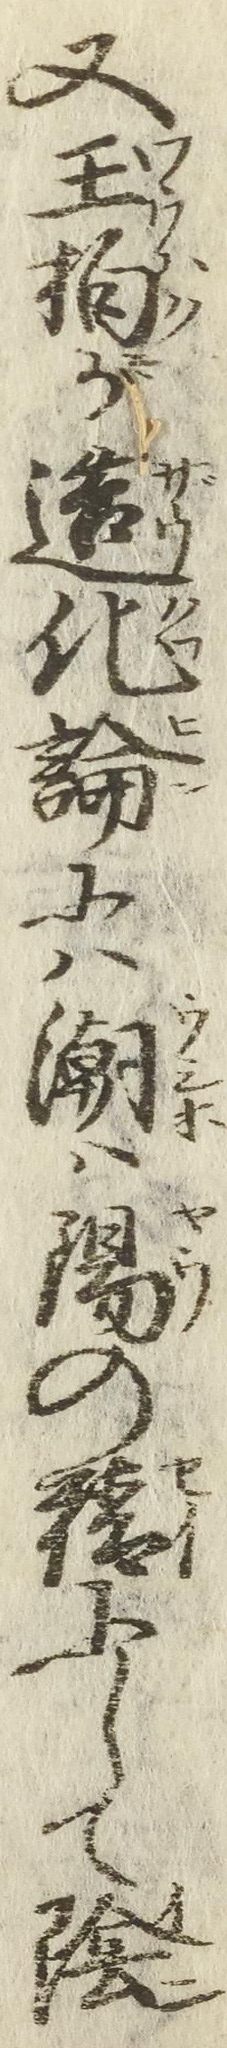又王柏が造化論には潮は陽の精にして陰
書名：天地或問珍　天
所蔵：東京大学地震研究所図書室 Earthquake Research Institute Library, The University of Tokyo, JAPAN
